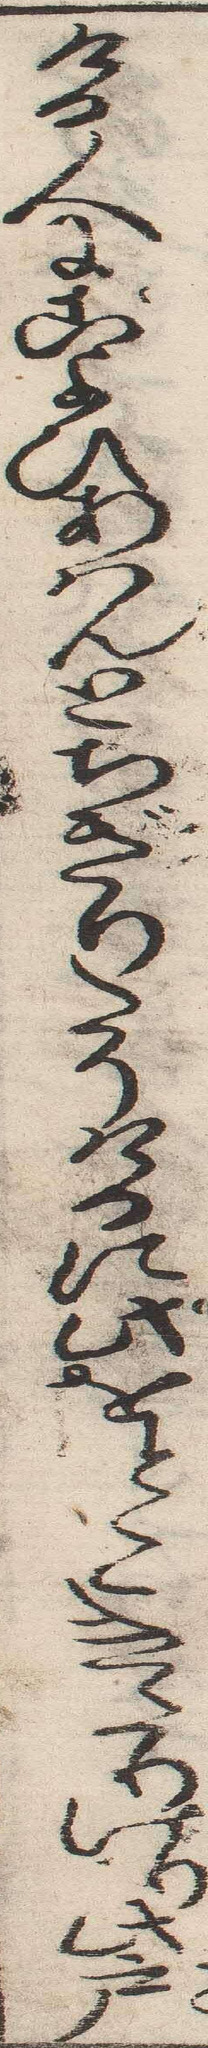ける人に。こよひあはんとちぎりたりけるに。此をとこきたりけり此戸

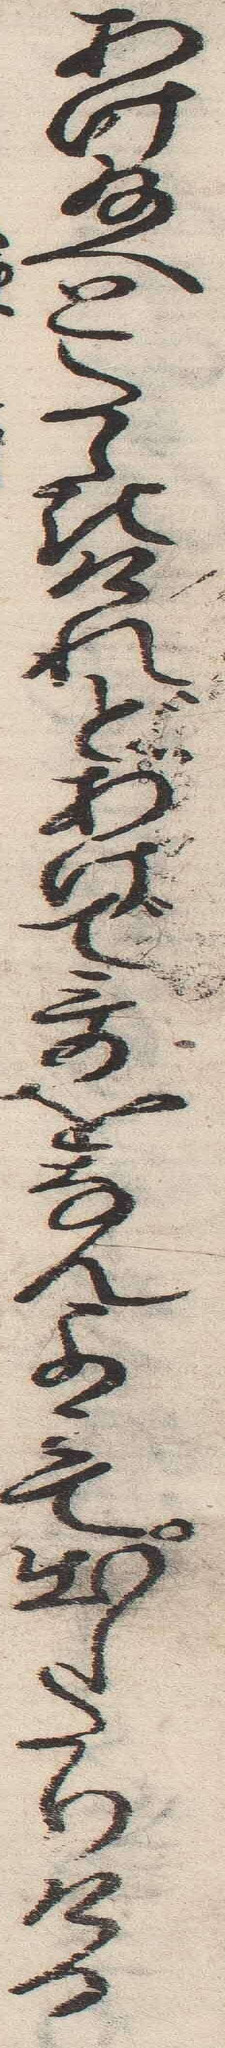あけ給へとたゝきけれど。あけで哥をなんよみて。出したりける
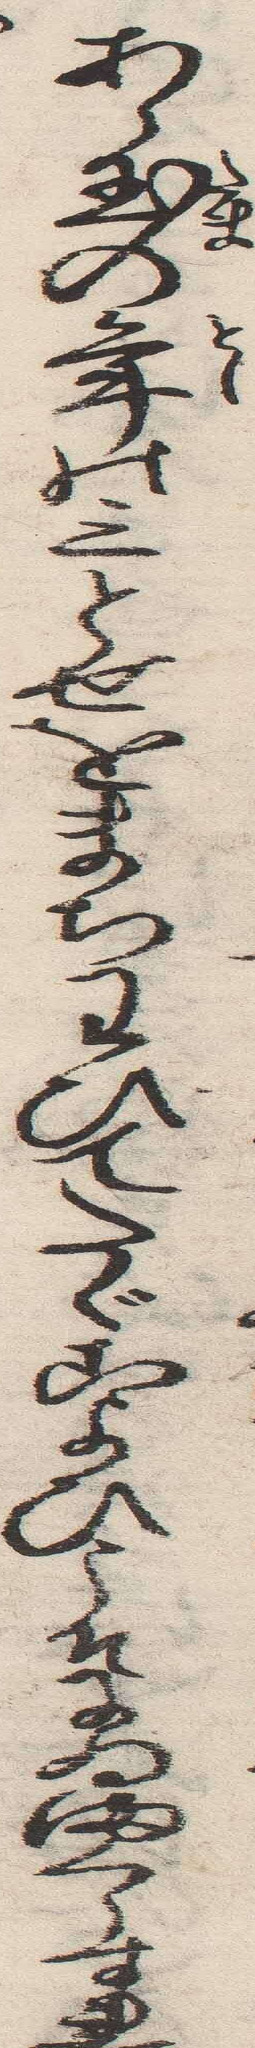あら玉の年のみとせをまちわひてたゞこよひこそにゐまくらすれ
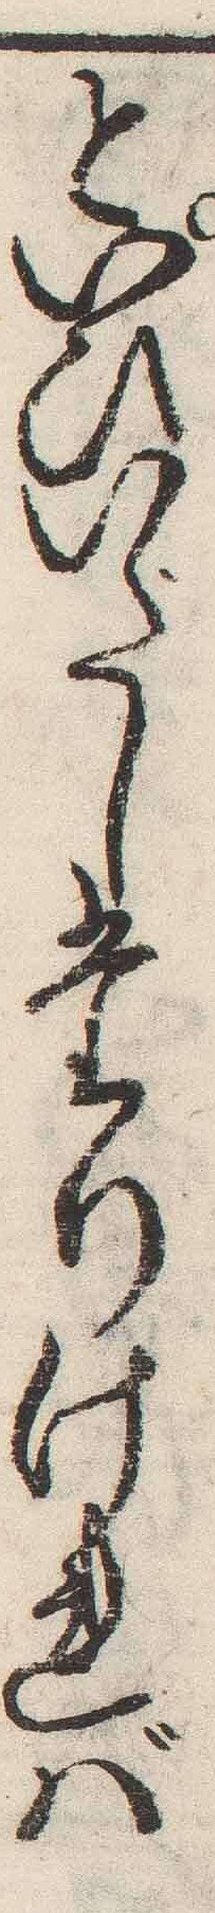と。いひいだしたりければ
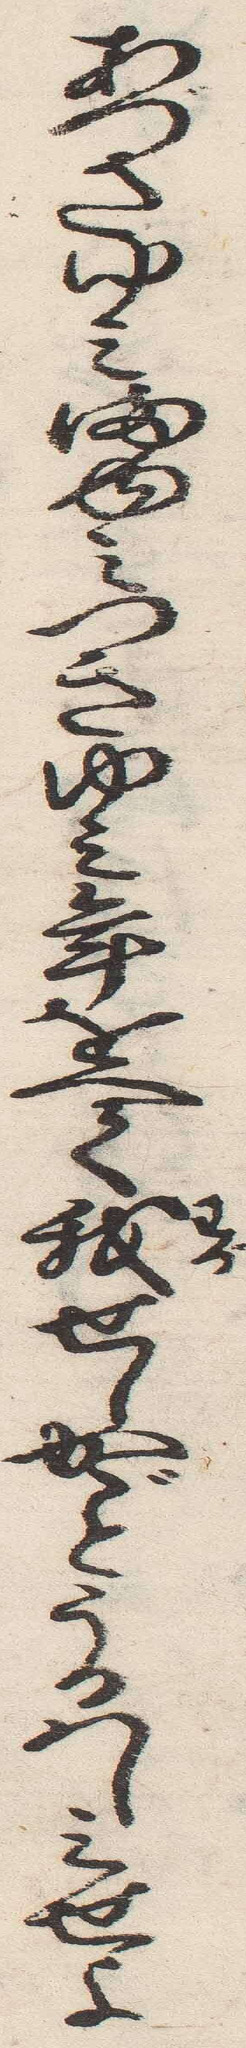あづさゆみまゆみつきゆみ年をへて我せしかごとうるはしみせよ
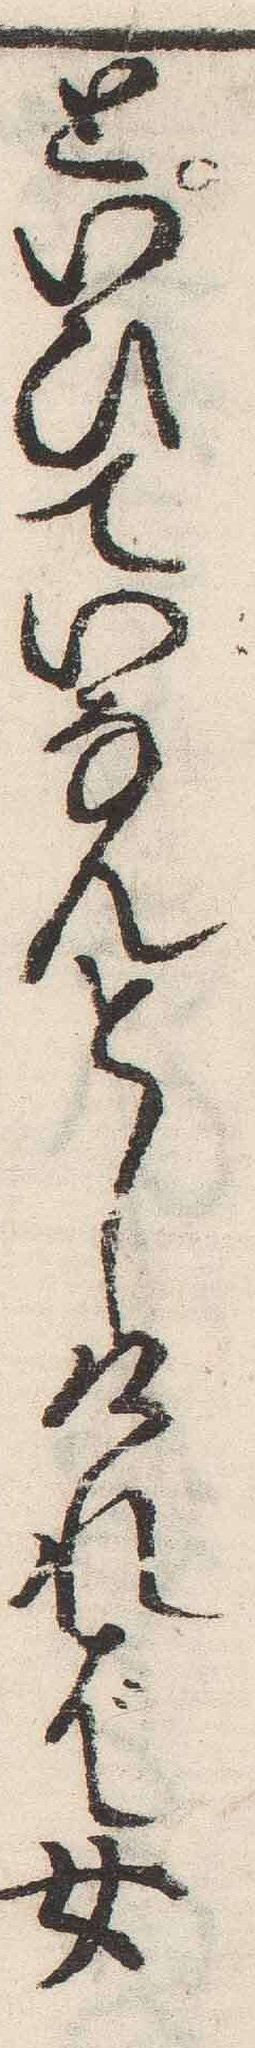と。いひていなんとしければ女
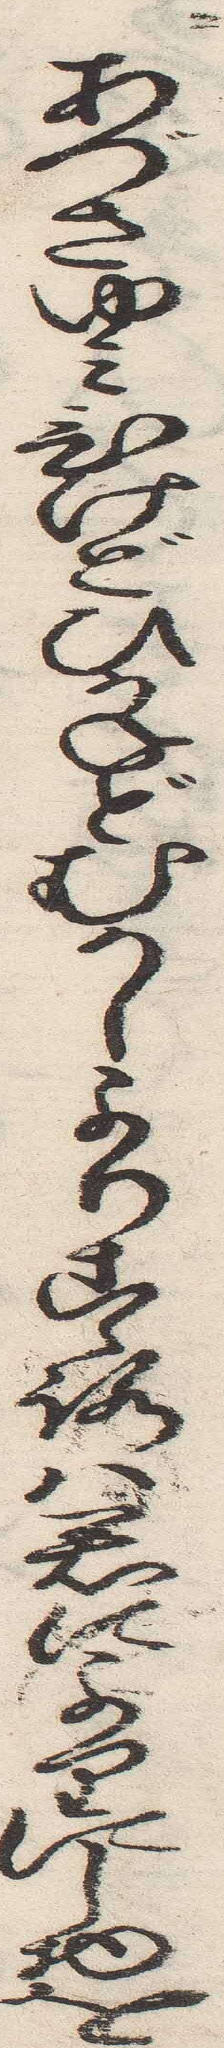あづさゆみひけどひかねどむかしよりこゝろは君によりにし物を
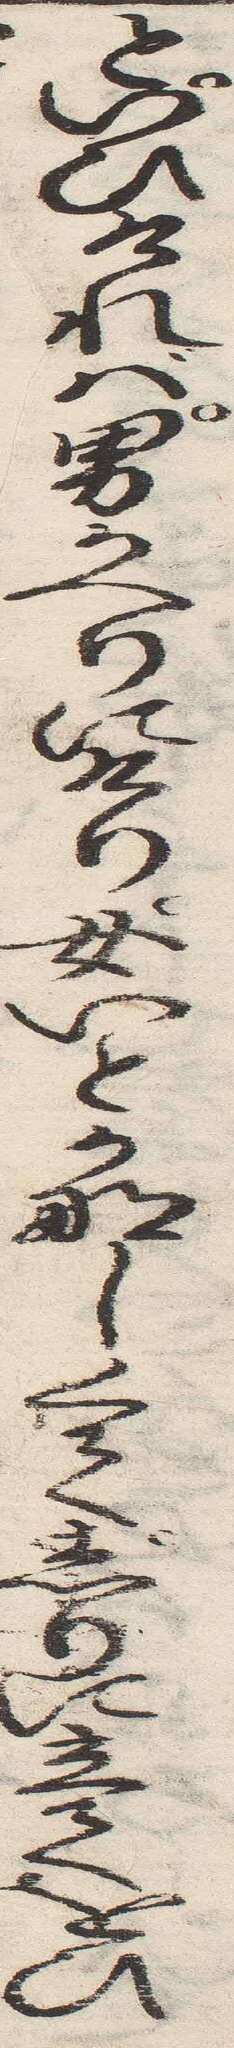と。いひければ。男かへりにけり。女いとかなしくて。しりに立てをひ
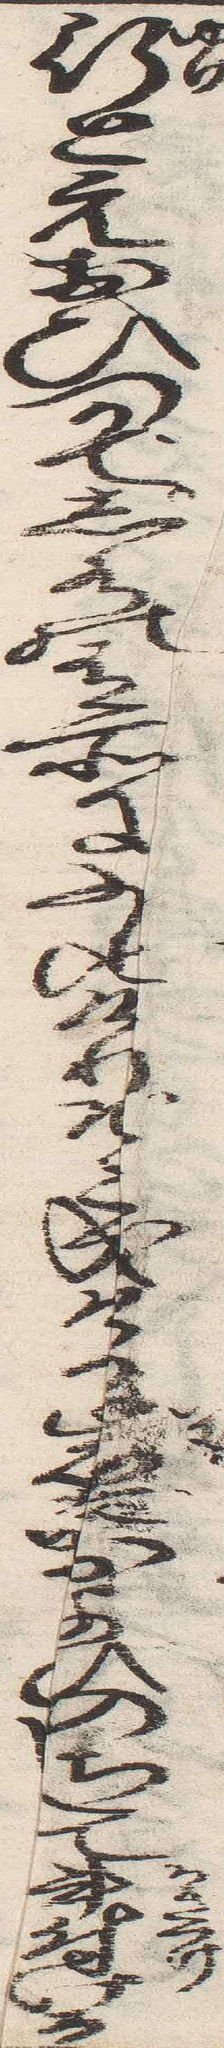行とえおひつかで。し水の有所にふしにけり。そこ成ける岩におよひのちして書付ける
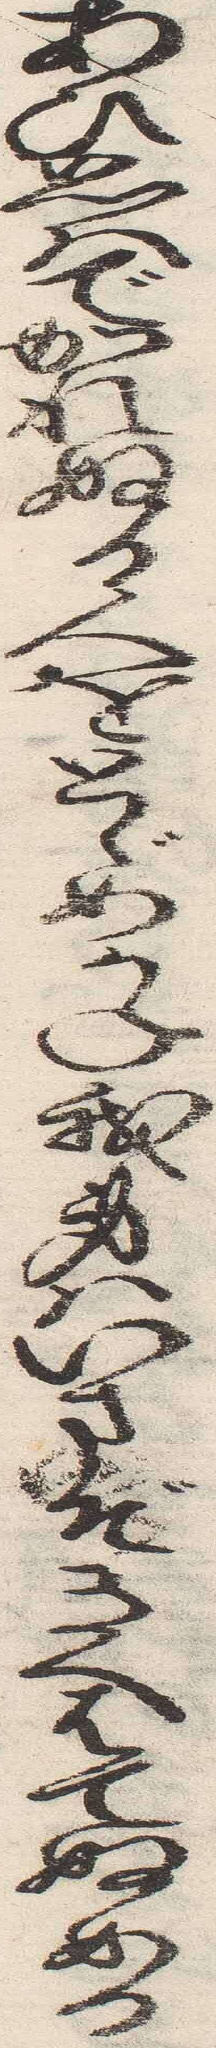あひ思はでかれぬる人をとゞめかね我身はいまぞきへはてぬめる
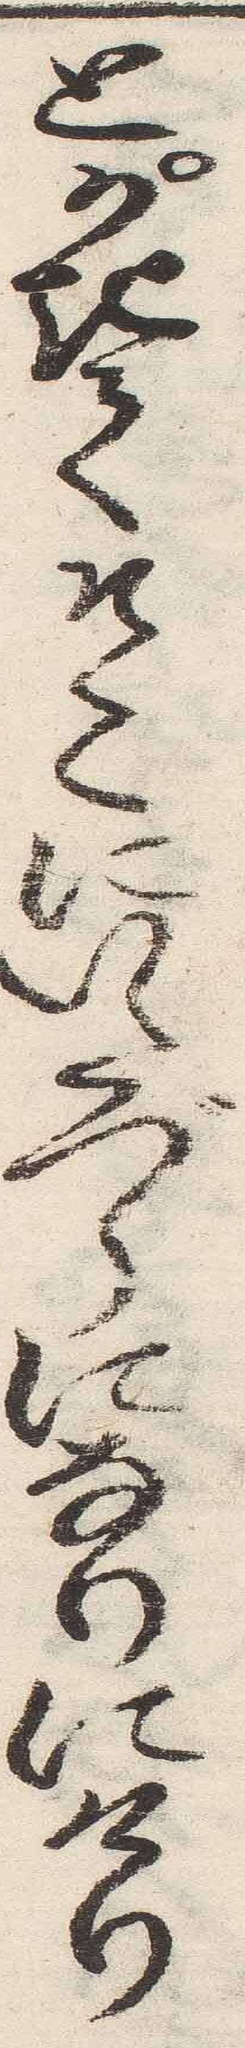と。かきてそこにいたづらになりにけり
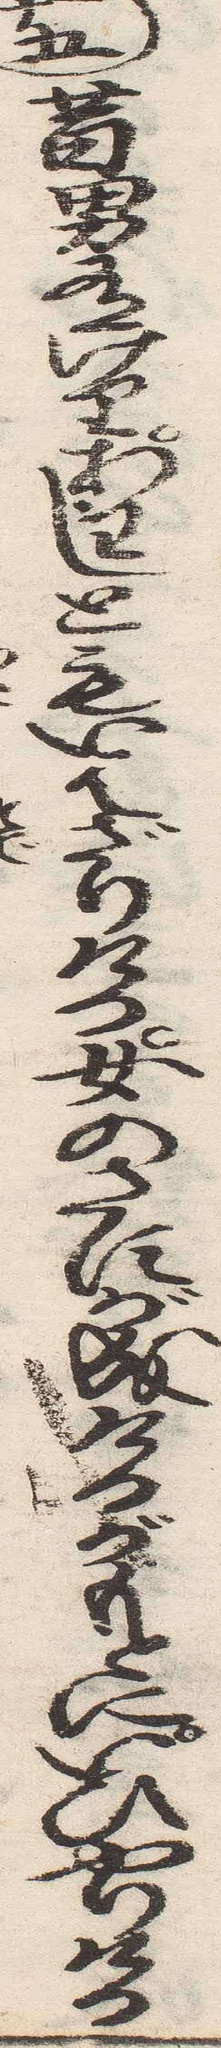廿五昔男有けり。あわしともいはざりける。女のさすが成けるがもとに。いひやりける
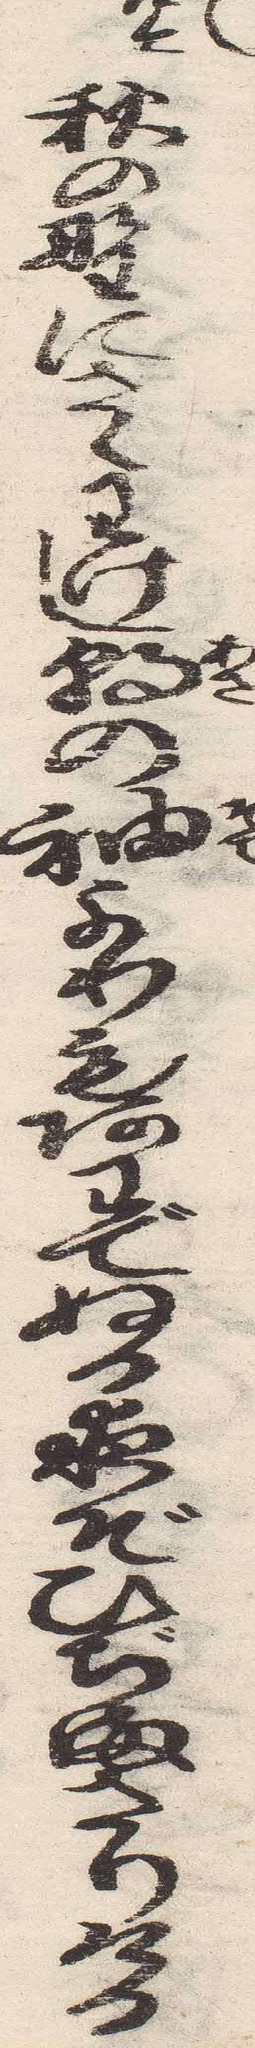古今秋の野にさゝわけし朝の袖よりもあわでぬる夜ぞひぢまさりける
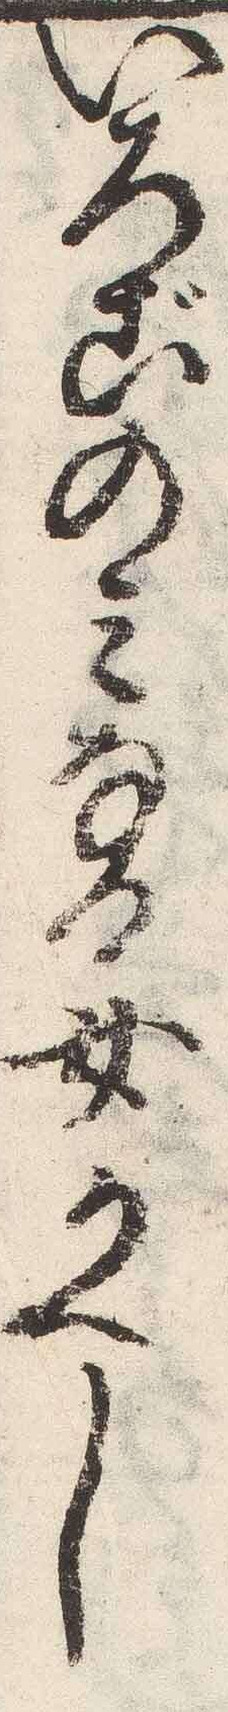いろごのみなる女かへし

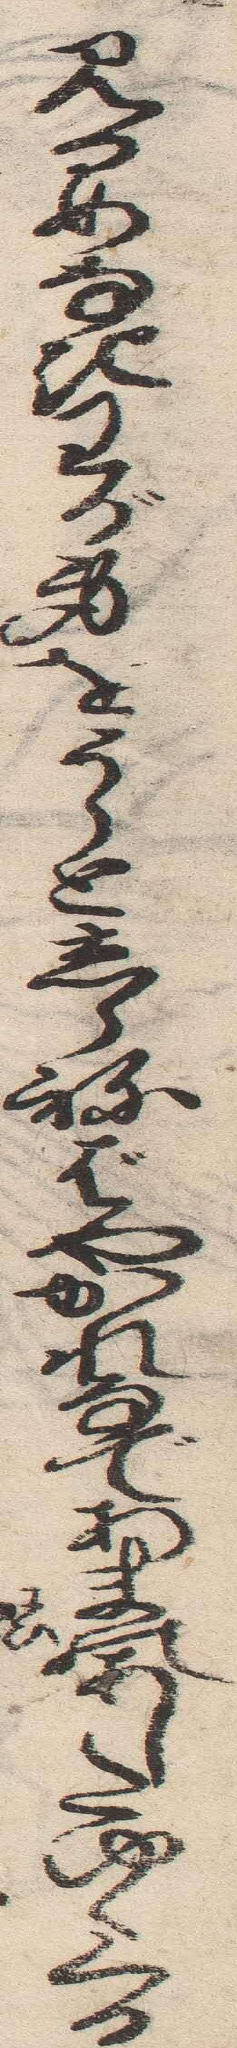古今見るめなきわが身をうらとしらねばやかれなであまのあしたゆくくる
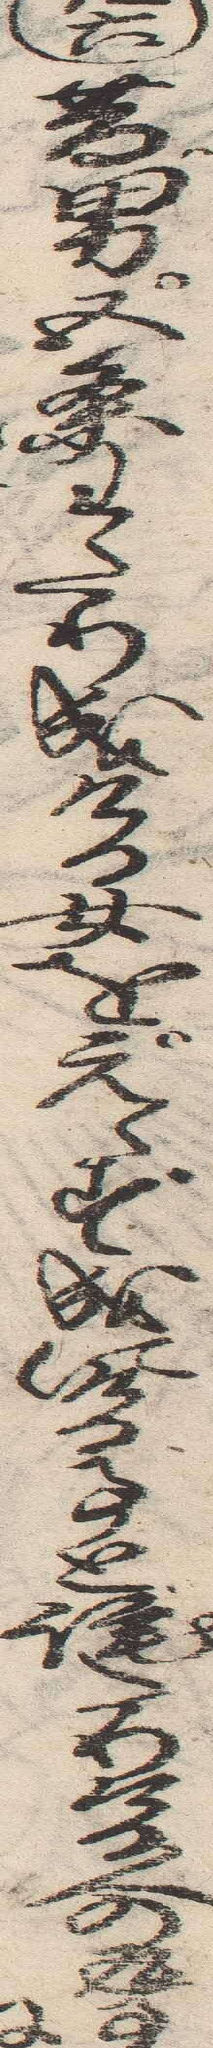廿六昔。男。五条わたり成ける女を。えゝず成にける事と詫たりける人の返事に
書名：伊勢物語
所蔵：東京学芸大学附属図書館 国文学研究資料館
